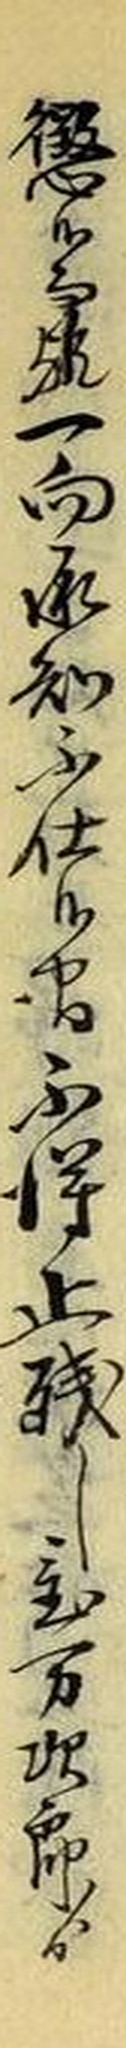懲候而欤一向承知不仕候間不埒止残し置万次郎ゟ
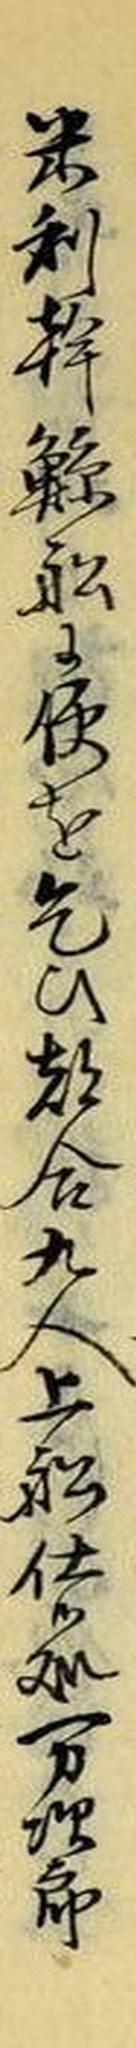米利幹鯨船に使を乞ひ都合九人上船仕候処万次郎
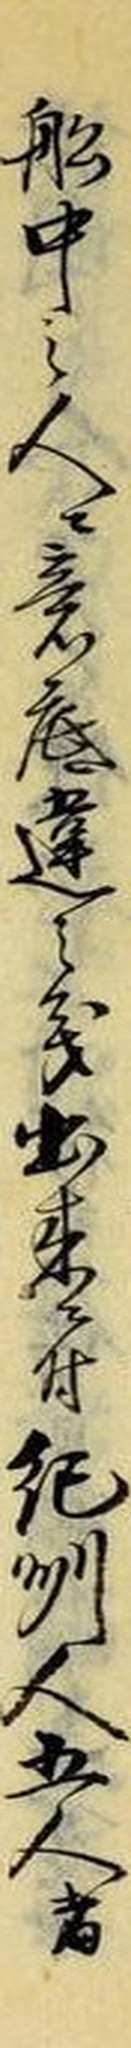船中の之人二意底違之義出来ニ付紀州人五人者
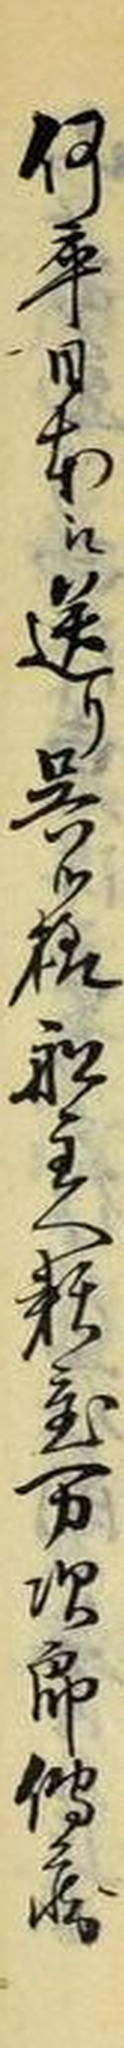何卒日本江送り呉候様船主へ頼置万次郎傳蔵
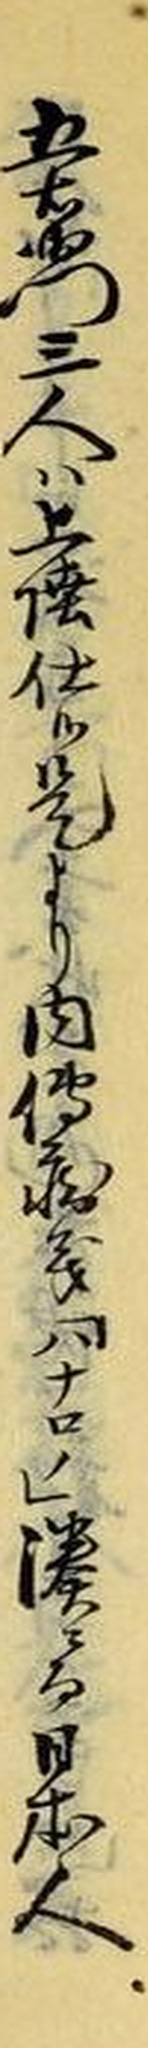五右衛門三人ハ上陸仕候是より内傳蔵義「ハナロノ」湊ニ而日本人
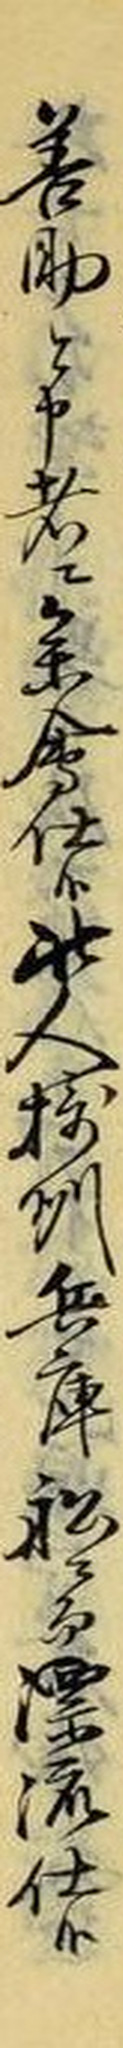善助と申者ニ参会仕候此人播州兵庫船ニ而漂流付候
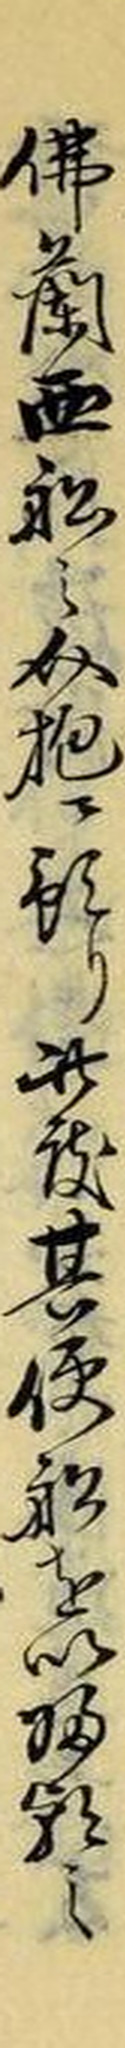佛蘭西船之介抱ニ預り此度其便船を以帰朝之
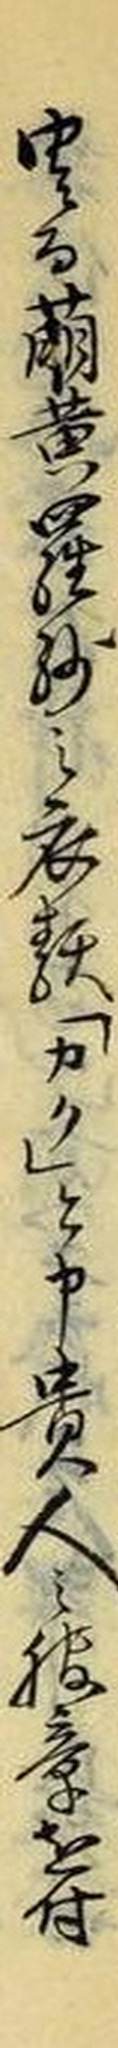中ニ而萌黄羅紗之衣類「カク」と申貴人之服章を付
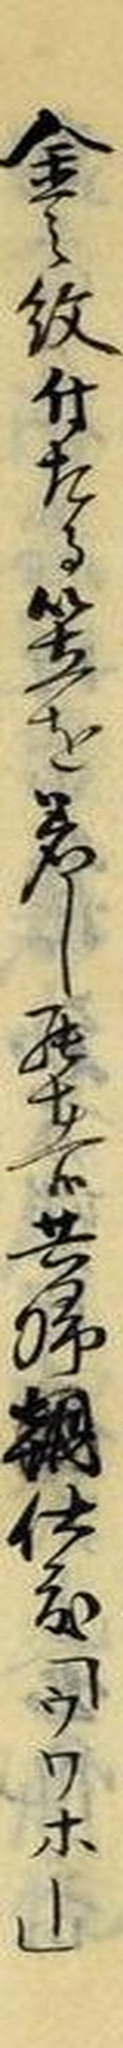金之紋付たる笠を着し罷在候共帰朝仕度「ウワホー」
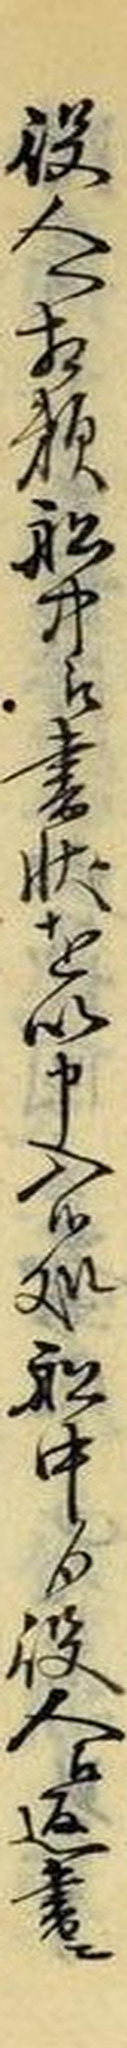役人へ相頼船中江書状を以申入候処船中ゟ役人江返書ニ
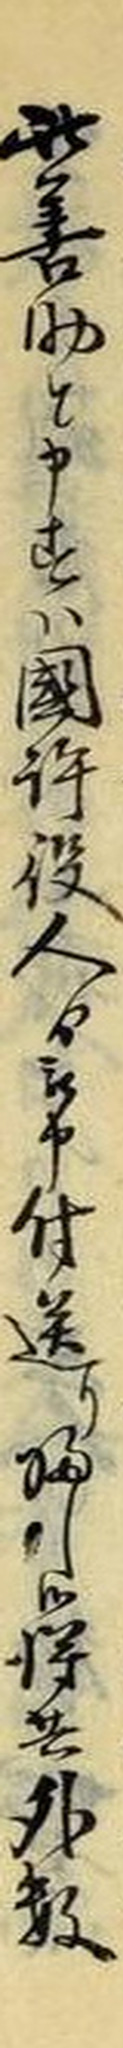此善助と申すハ国許役人ゟ被申付送り帰し候得共外数
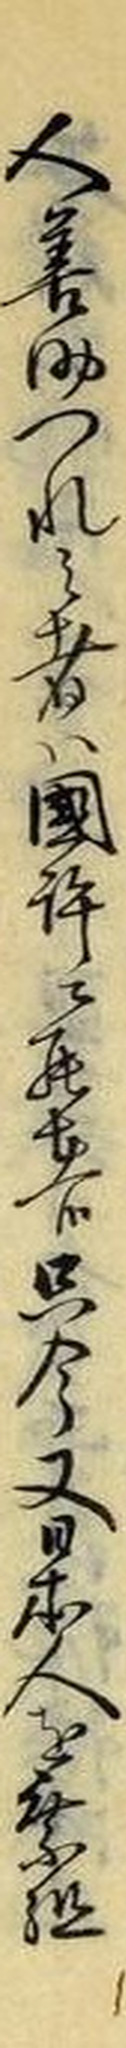人善助つれ之者ハ国許ニ罷在候只今又日本人を乗組
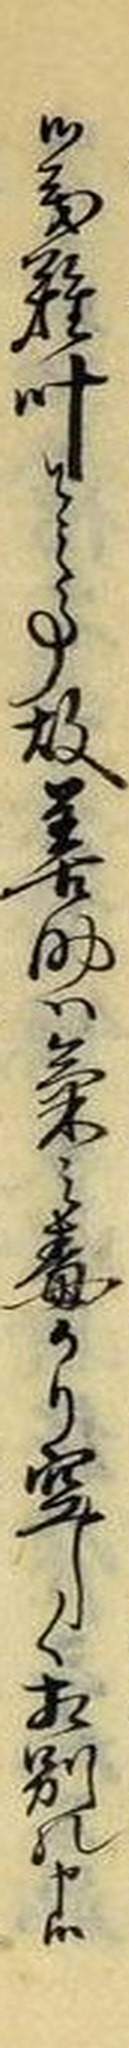候義難叶と之事故善助ハ気之毒かり空しく相別れ申候
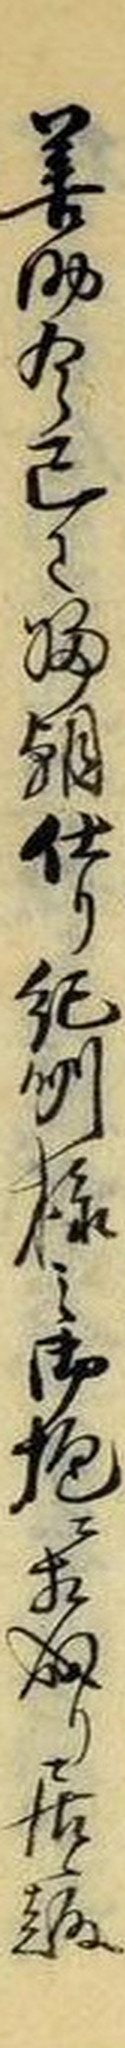善助今巳に帰朝仕り紀州様之御抱ニ相成り居趣
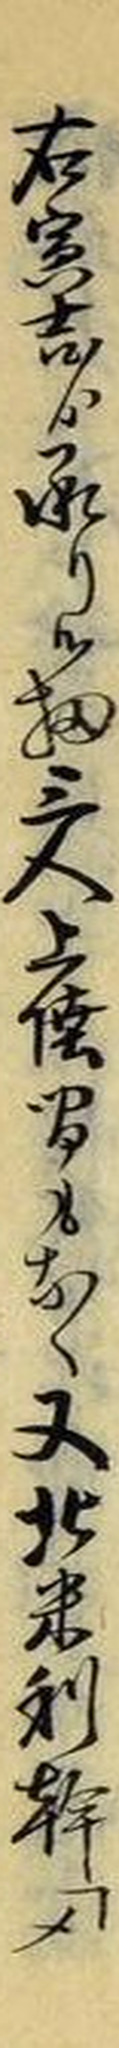右寅吉ゟ承り候扨三人上陸間もなく又北米利幹「メ
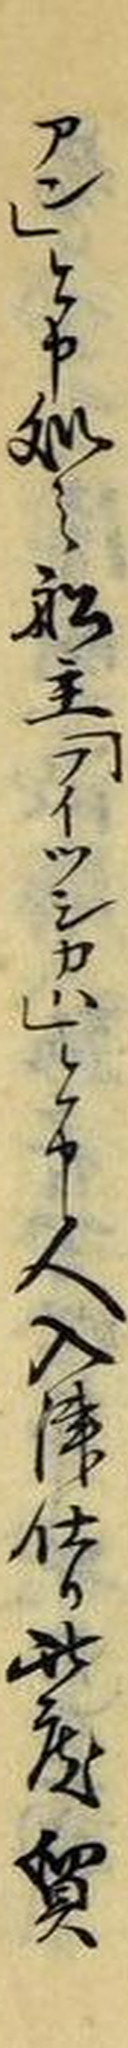アン」と申処之船主「フイツシカハ」と申人入津仕り此度貿
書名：漂客談奇（備考雑録写8）
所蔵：福井県文書館 Fukui Prefectural Archives
